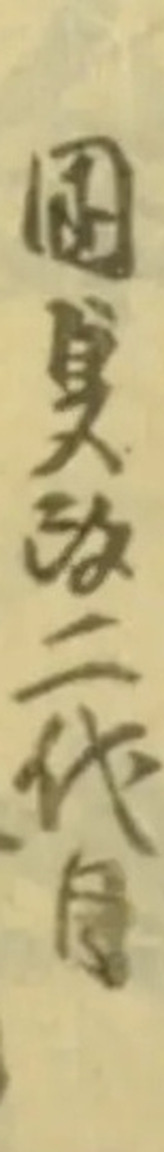国貞改二代目
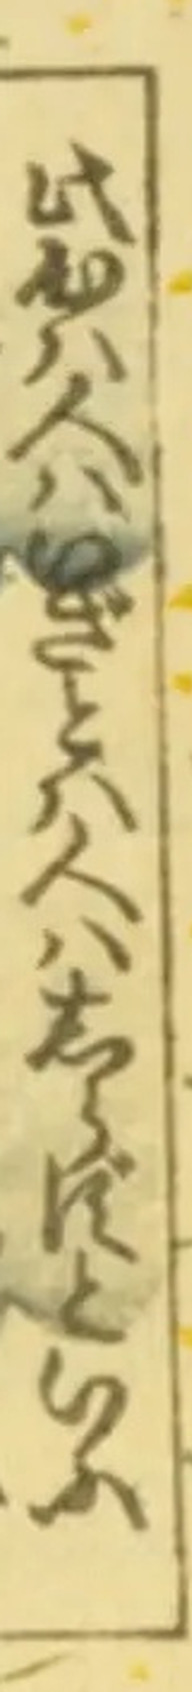此心は人はいざとは人はしらずといふ
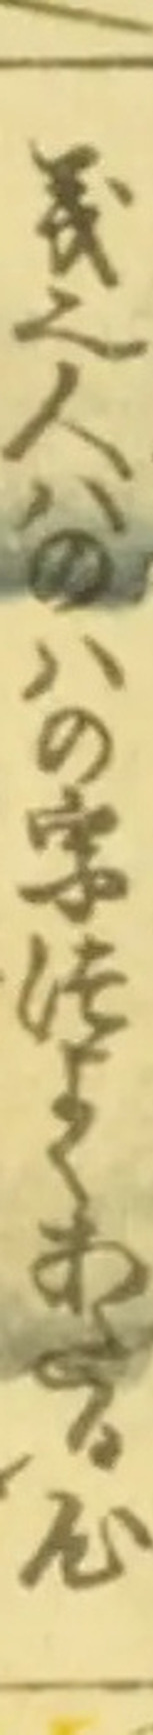義也人はのはの字つよくあたる心
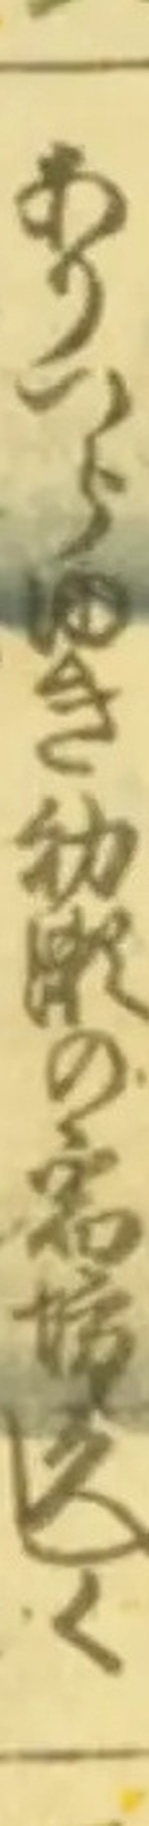ありつらゆき初瀬の宿坊久しく
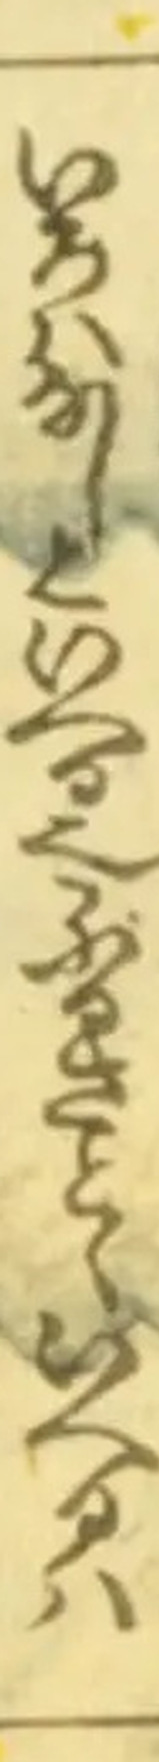いろはなしといへる也ふるさとゝいへるは
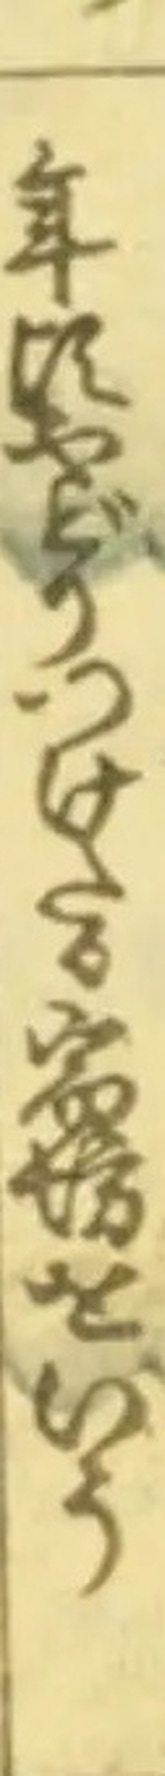年頃やどりつけたる宿坊をいう
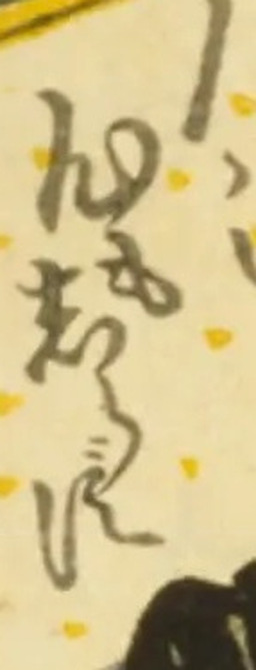しらず
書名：百人一首絵抄 三十四 紀貫之
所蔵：国立国会図書館 National Diet Library, JAPAN
